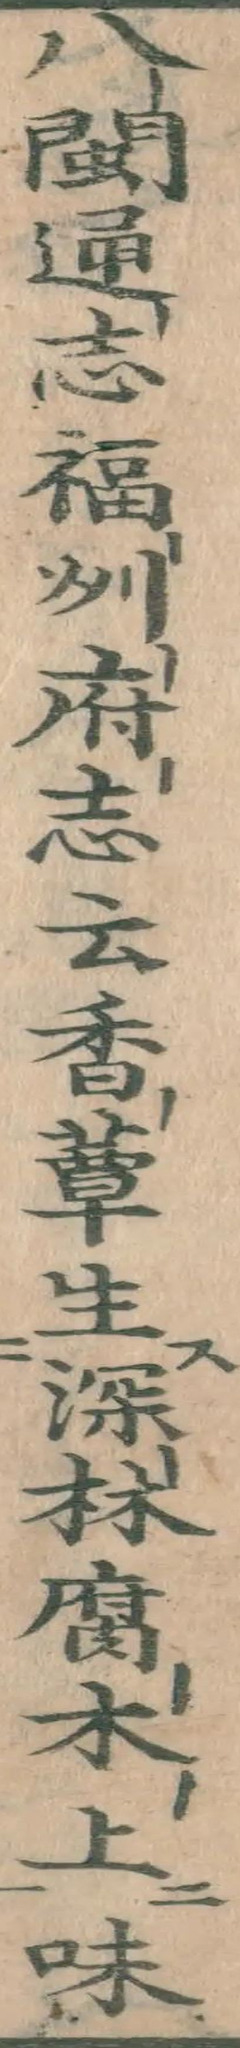八閩通志福州府志云香蕈生深林腐木上味
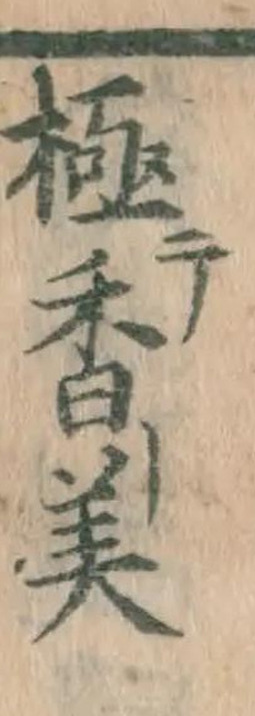極テ香美

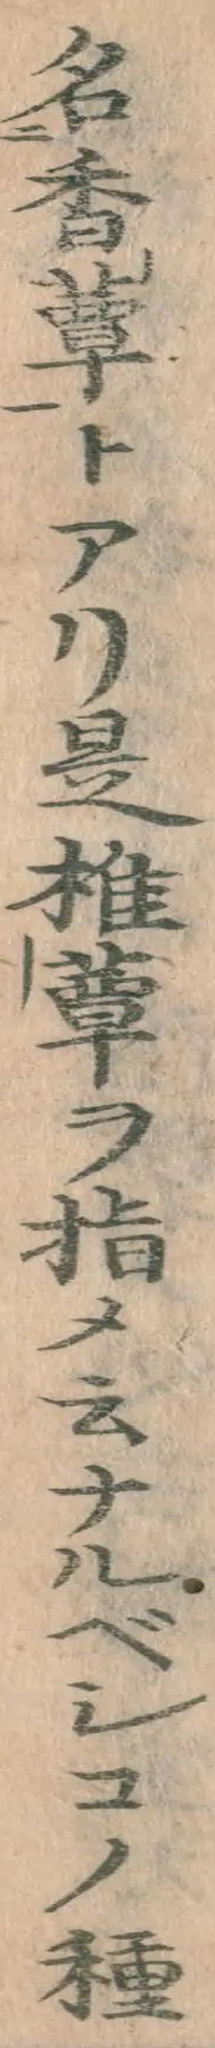名香蕈トアリ是椎蕈ヲ指シテ云ナルベシコノ種
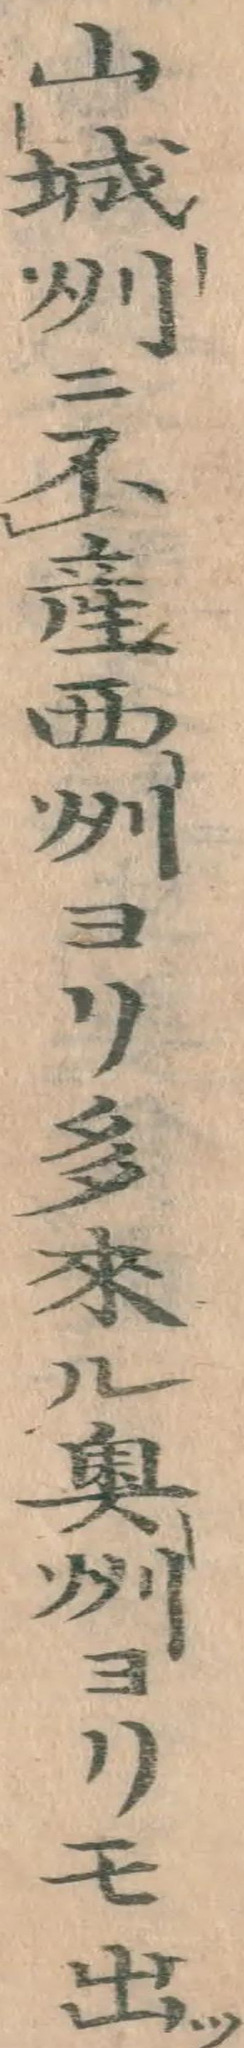山城州ニ不産西州ヨリ多来ル奥州ヨリモ出
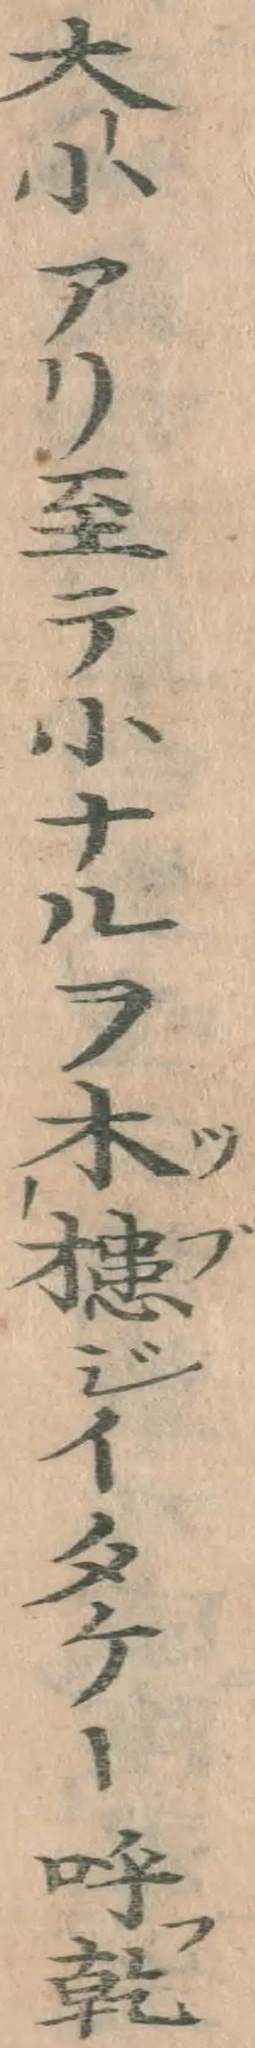大小アリ至テ小ナルヲ木槵ジイタケト呼乾
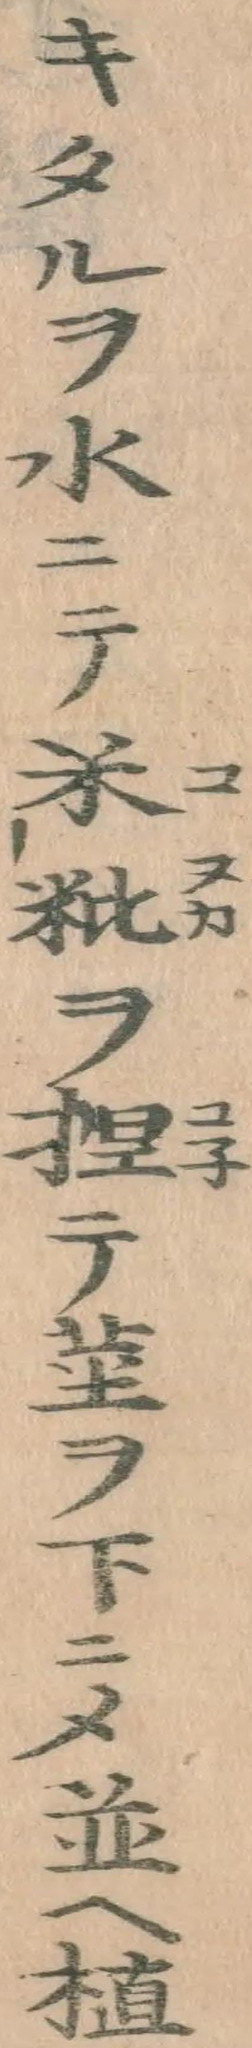キタルヲ水ニテ米粃ヲ捏テ茎ヲ下ニシテ並ヘ植
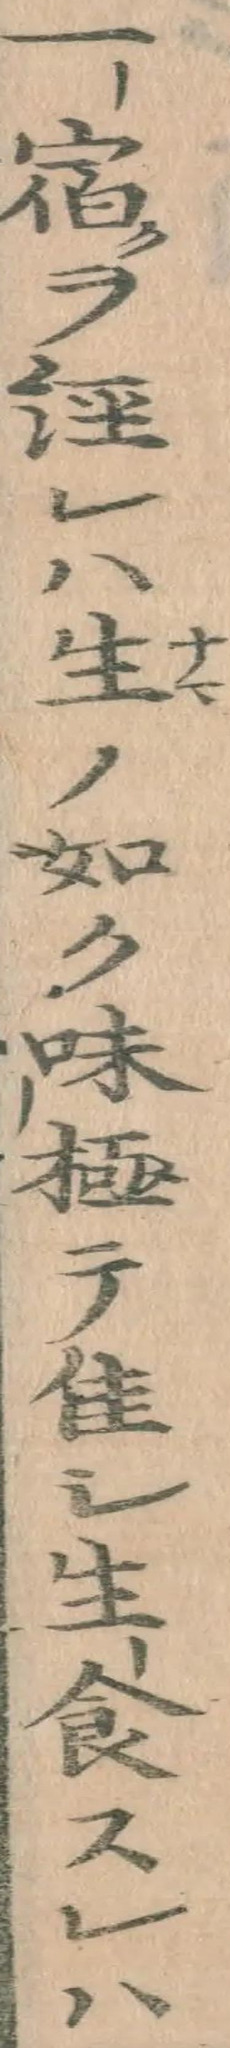一宿ヲ経レハ生ノ如ク味極テ佳シ生食スレハ
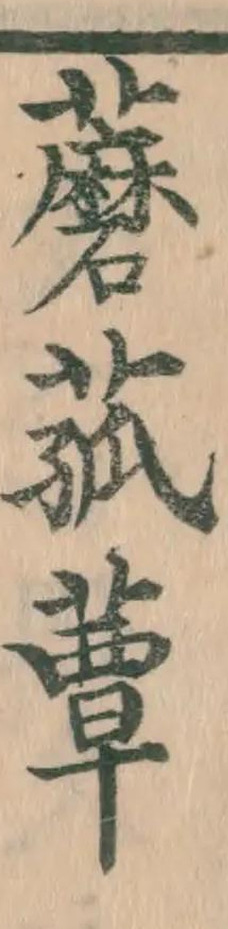蘑菰蕈
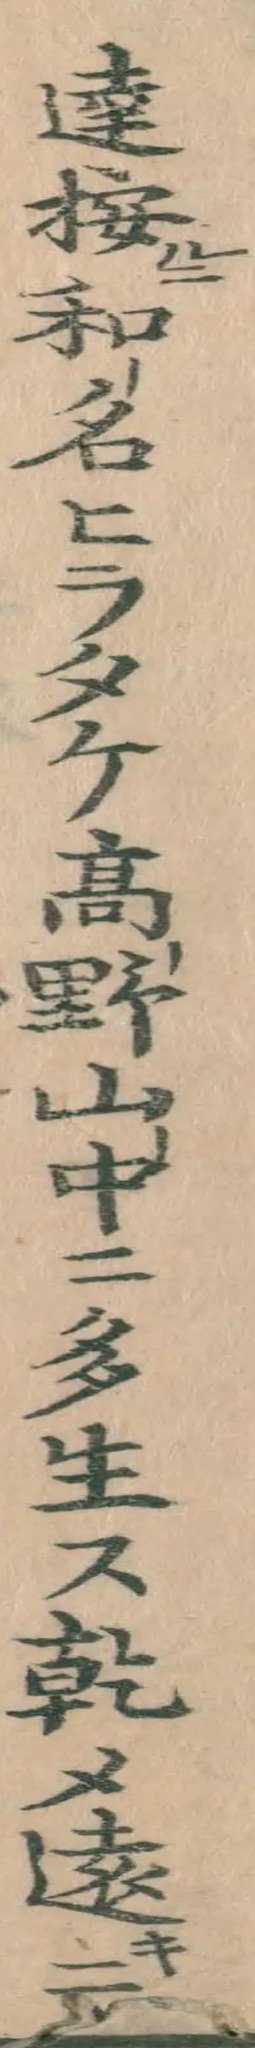達按和名ヒラタケ高野山中ニ多生ス乾シテ遠ニ
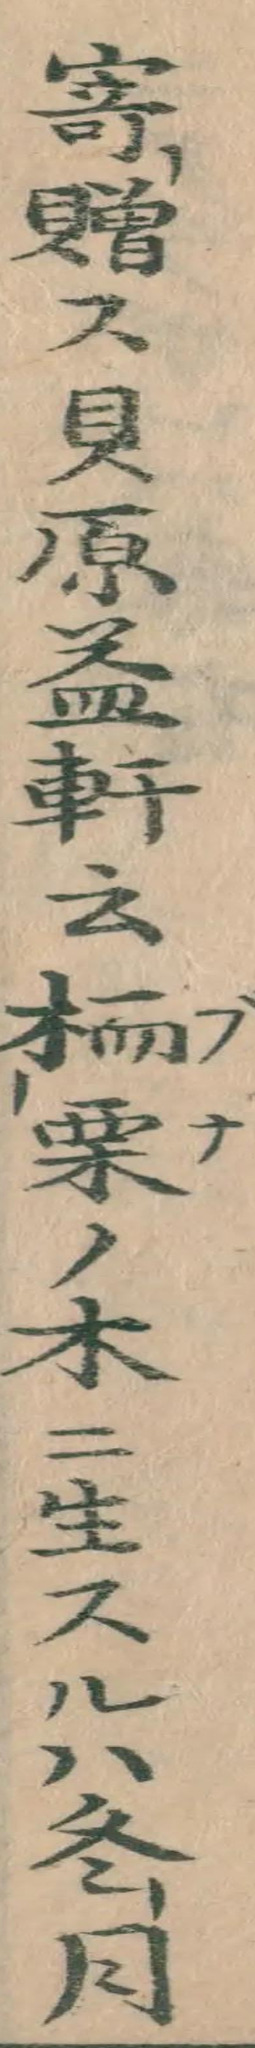寄贈ス貝原益軒云栭栗ノ木ニ生スルハ冬月

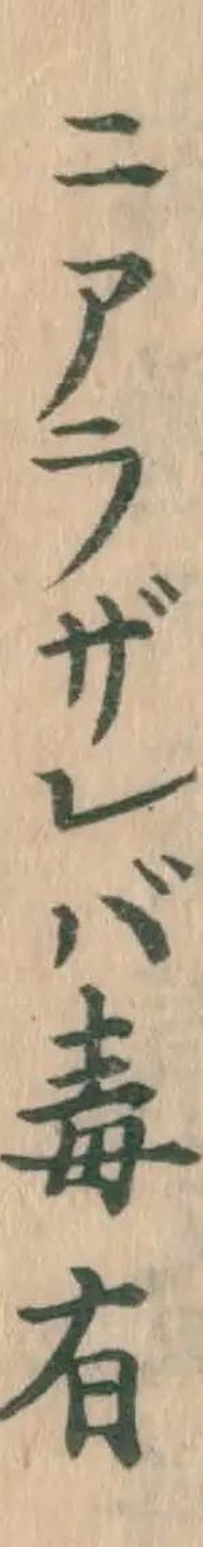ニアラザレバ毒有
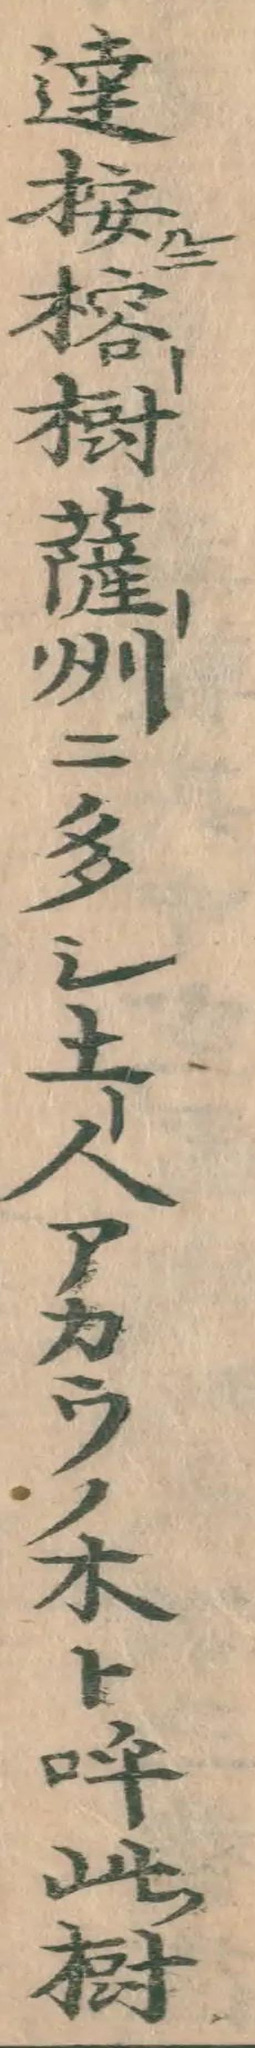達按榕樹薩州ニ多シ土人アカウノ木ト呼此樹
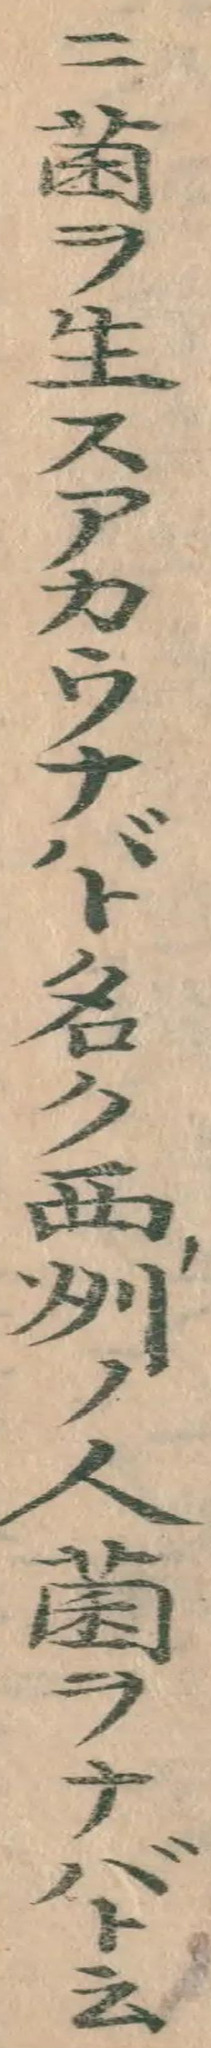ニ菌ヲ生スアカウナバト名ク西州ノ人菌ヲナバト云
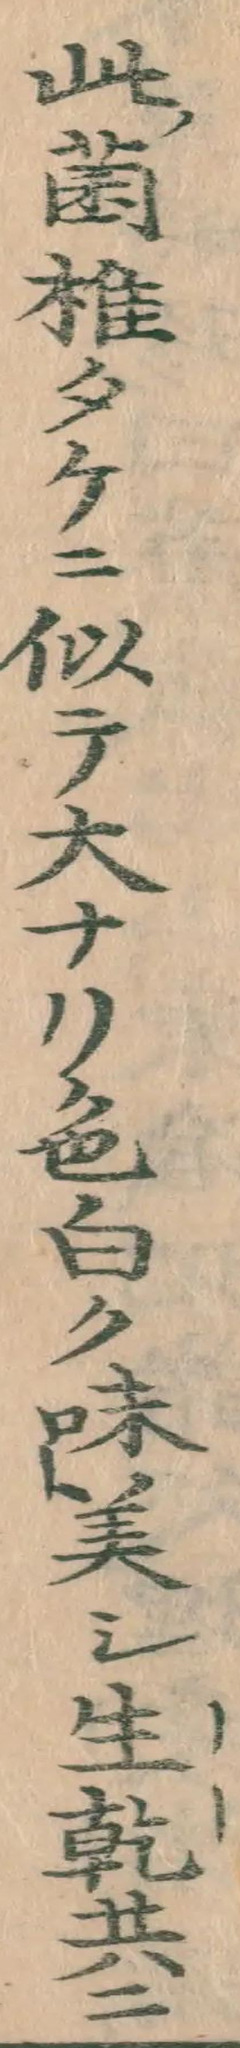此菌椎タケニ似テ大ナリ色白ク味美シ生乾共ニ
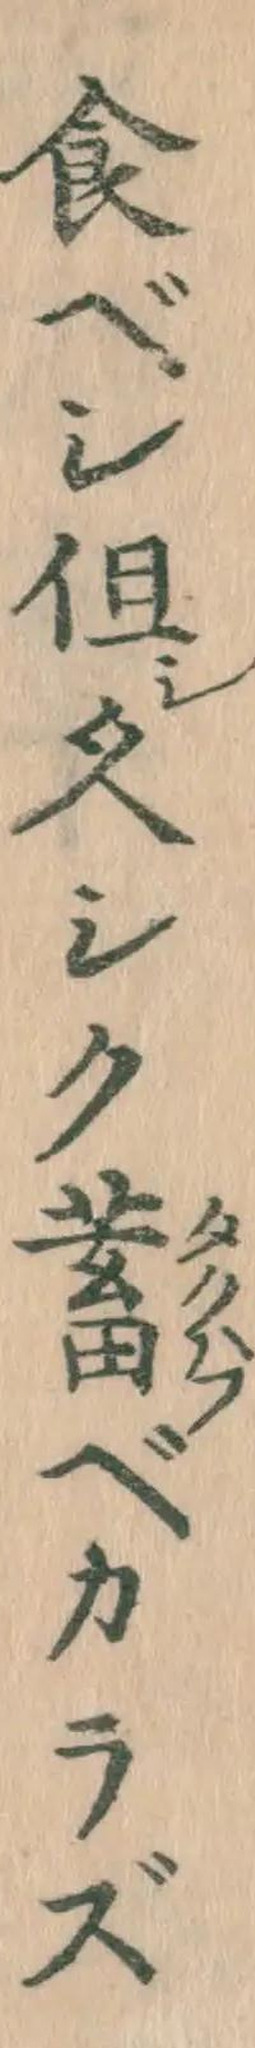食ベシ但久シク蓄ベカラズ
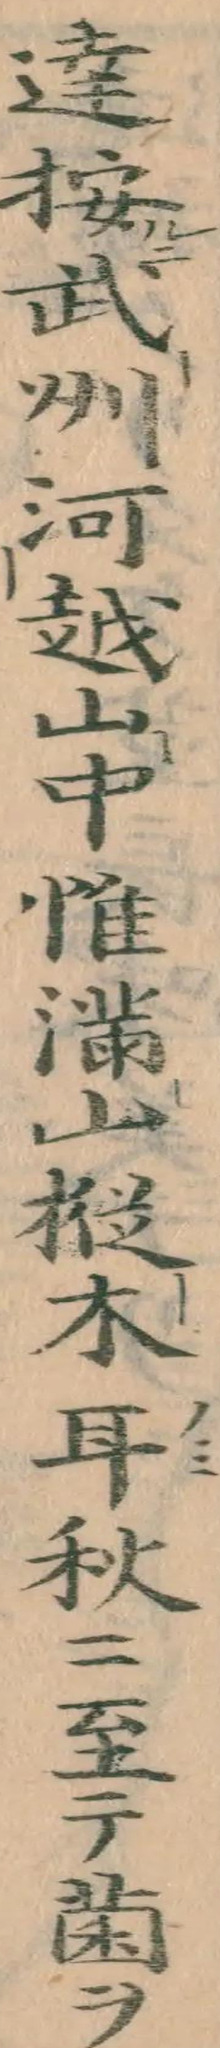達按武州河越山中惟満山樅木耳秋ニ至テ菌ヲ
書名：怡顔斎菌品 2巻
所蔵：国立国会図書館 National Diet Library, JAPAN
